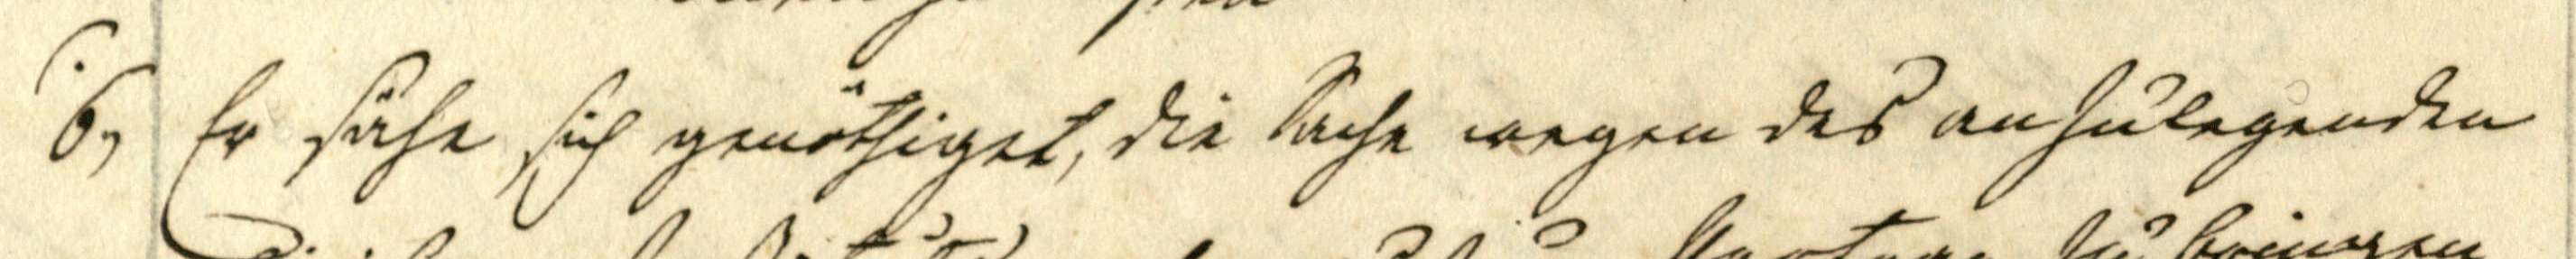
6., Er sähe sich genöthiget, die Sache wegen des anzulegenden
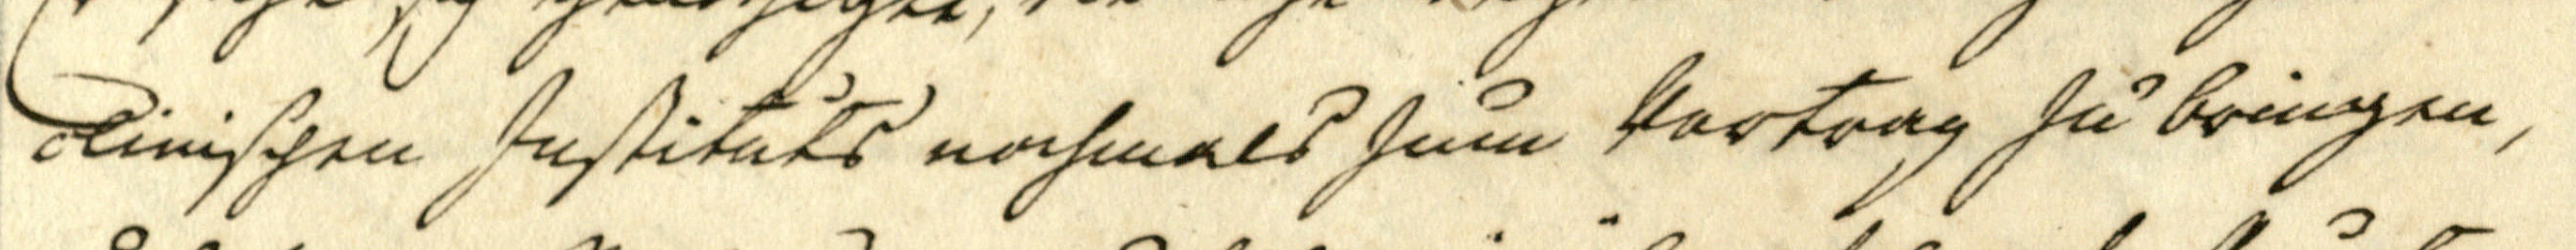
clinischen Instituts nochmals zum Vortrag zu bringen,
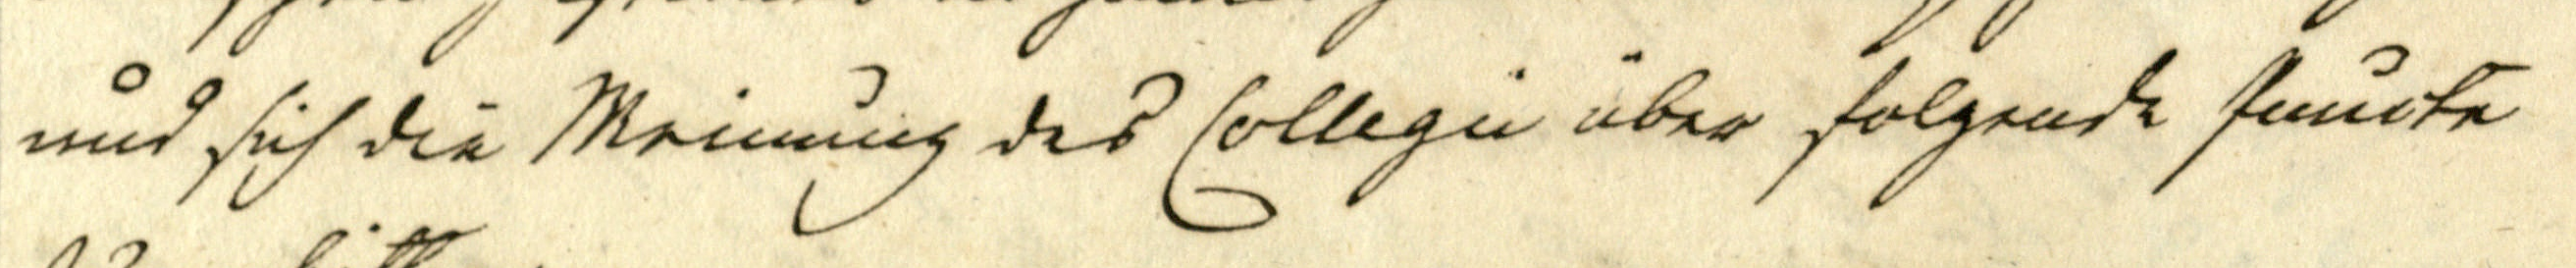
und sich die Meinung des Collegii über folgende Puncte
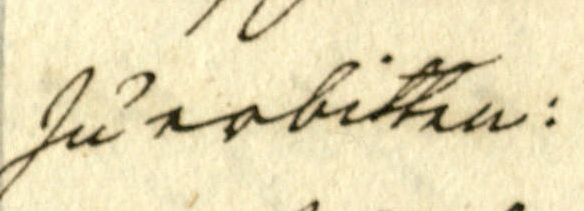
zu erbitten.
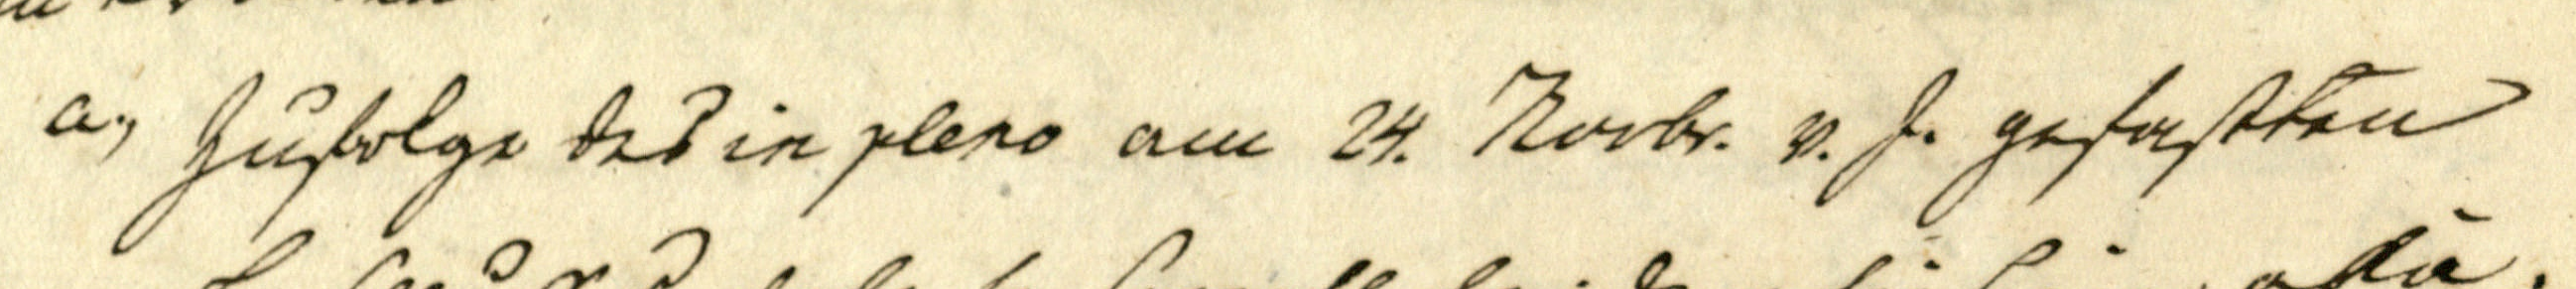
a, Zufolge des in pleno am 24. Novbr. v. J. gefaßten
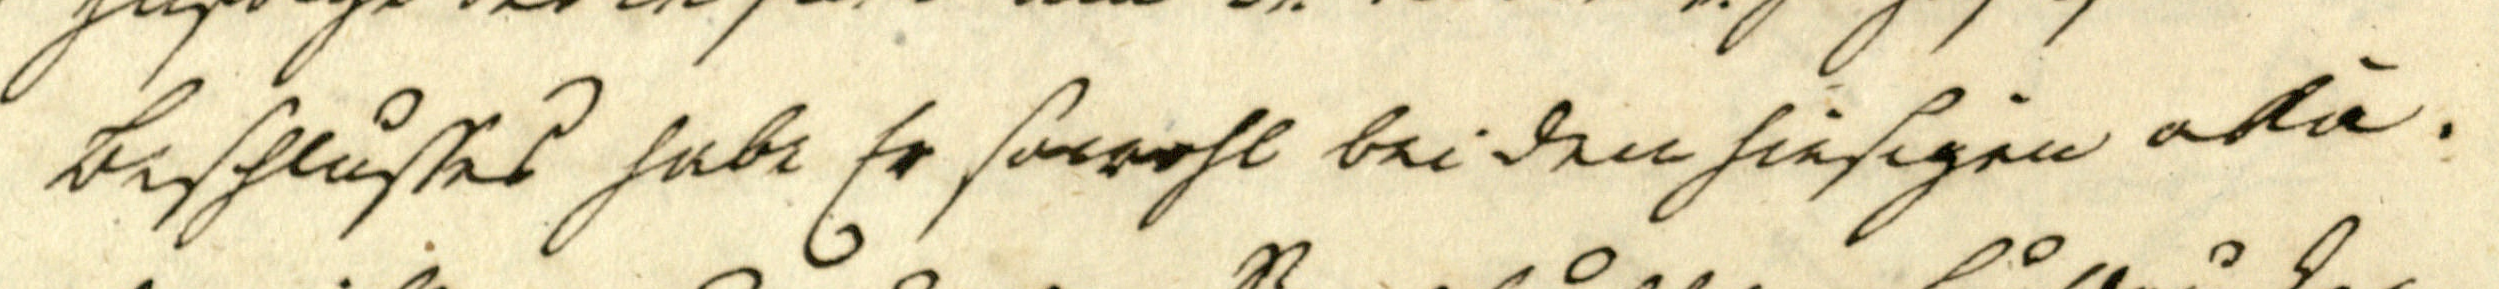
Beschlusses habe Er sowohl bei den hiesigen aka¬
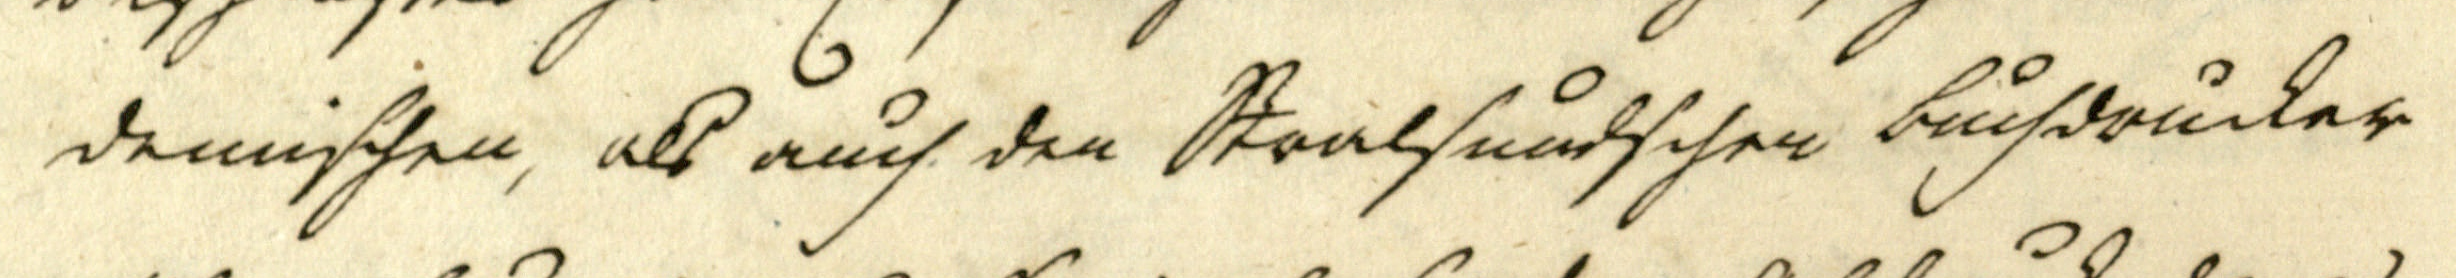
demischen, als auch den Stralsundschen Buchdrucker
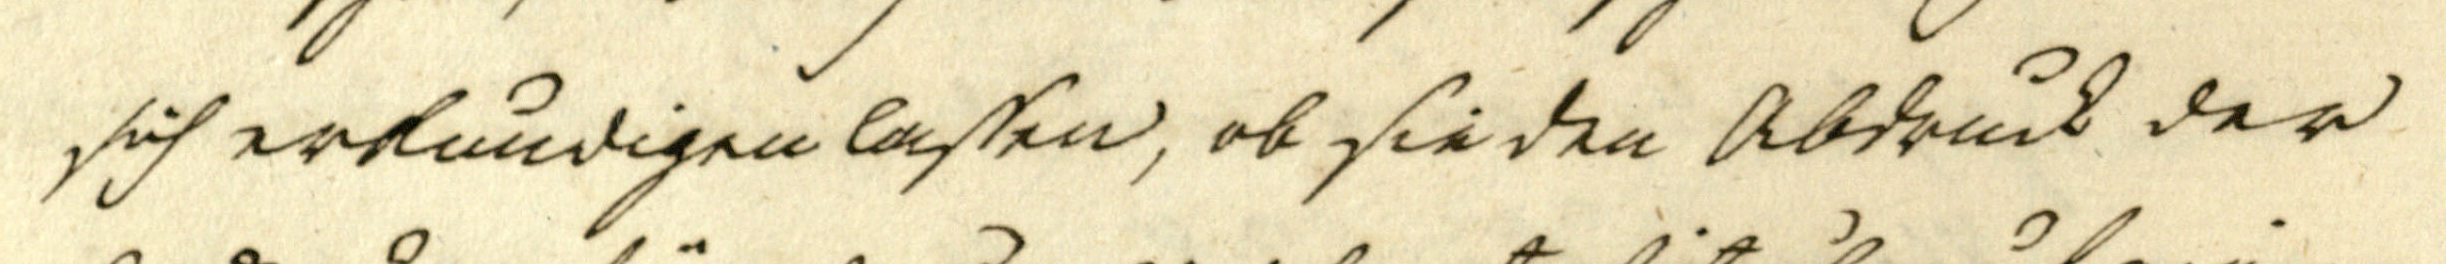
sich erkundigen lassen, ob sie den Abdruck der
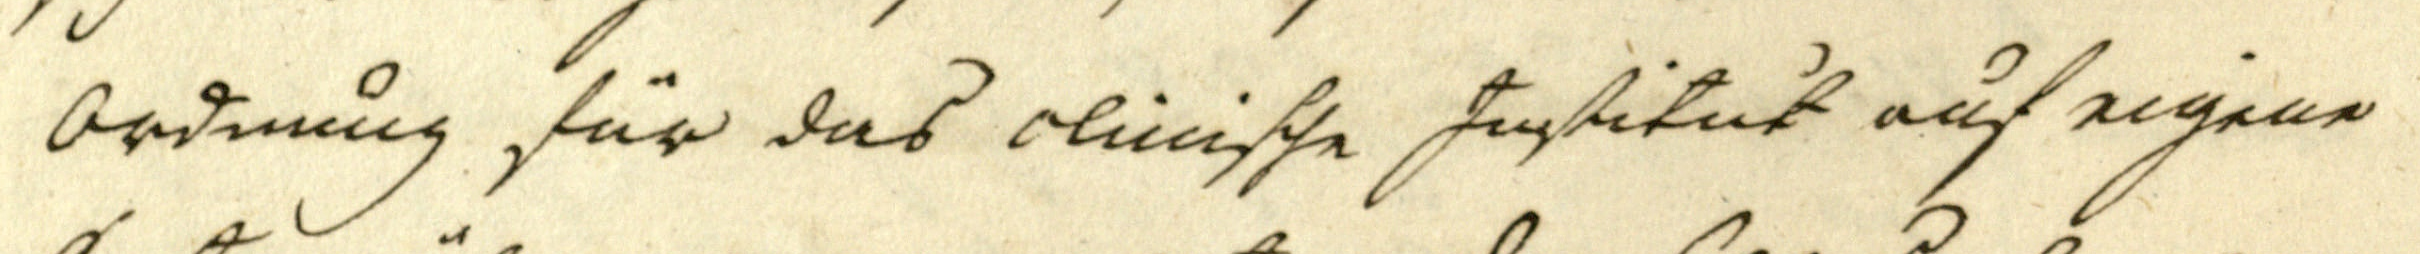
Ordnung für das clinische Institut auf eigene
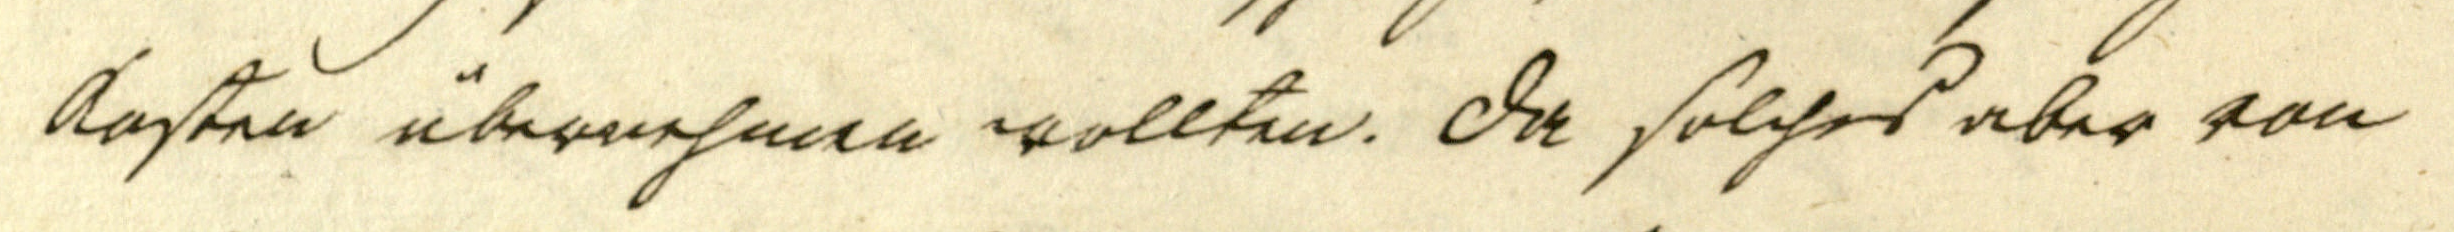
Kosten übernehmen wollten. Da solches aber von
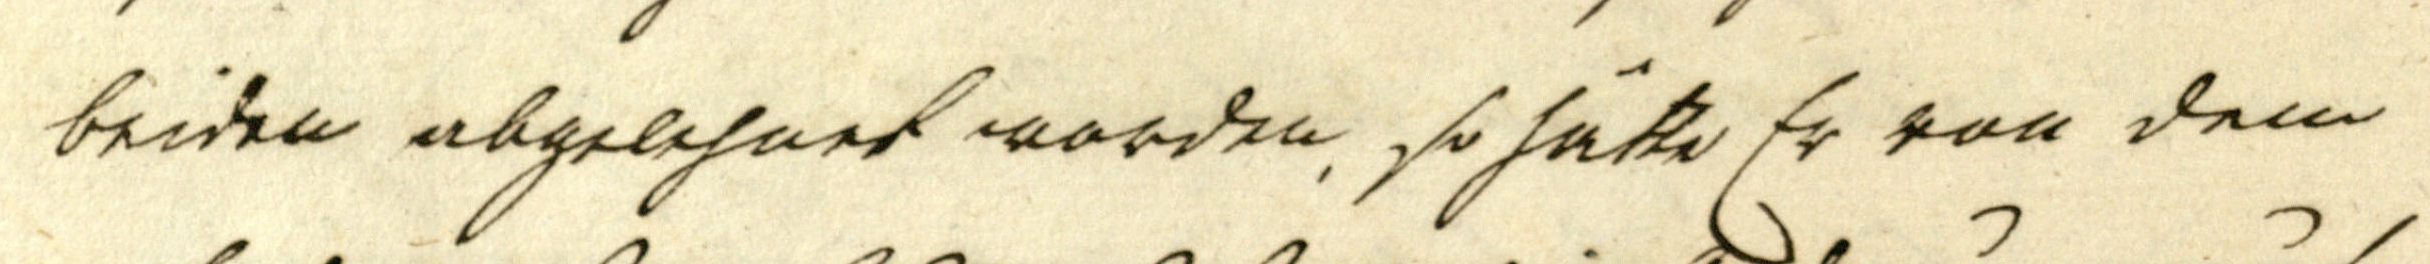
beiden abgelehnet worden, so hätte Er von dem
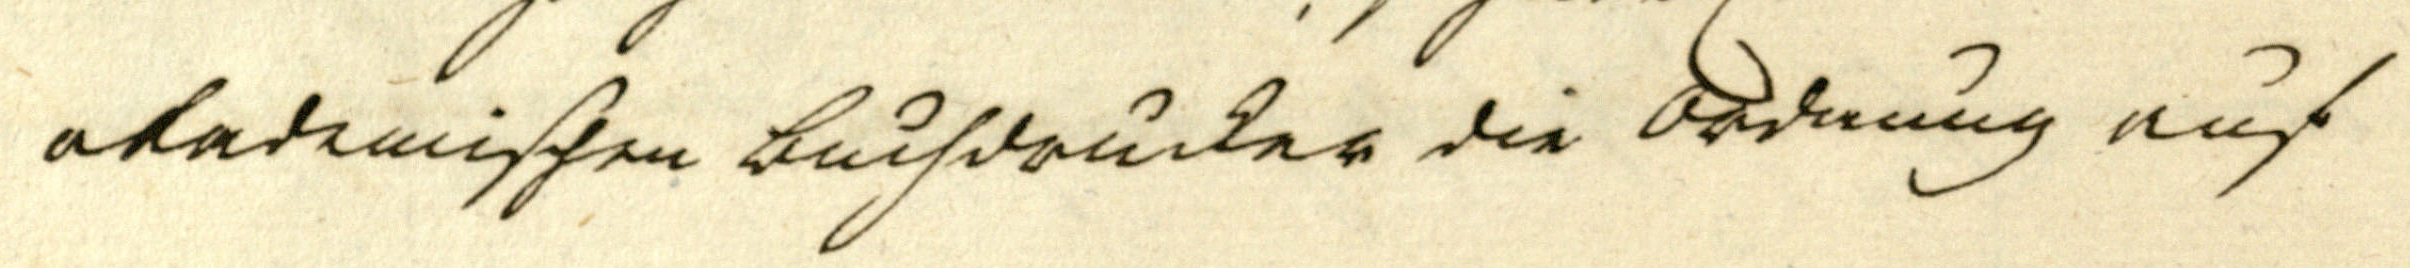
akademischen Buchdrucker die Ordnung auf
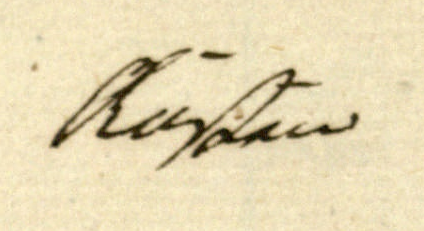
Kosten
